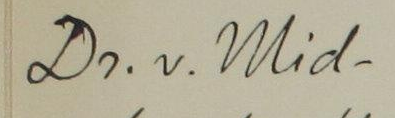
Dr. v. Mid-
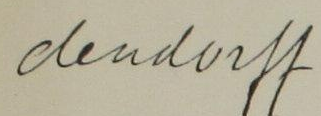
dendorff
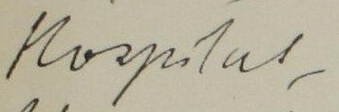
Hospital
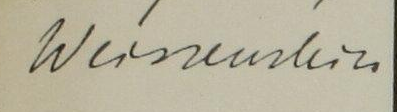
Weissenstein
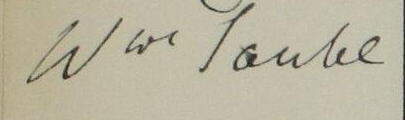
Wwe Taube
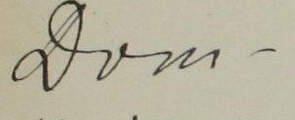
Dom-
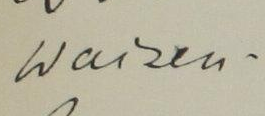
waisen
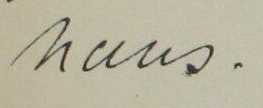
haus.
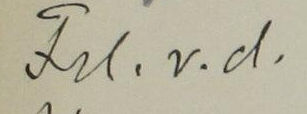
Frl. v.d.
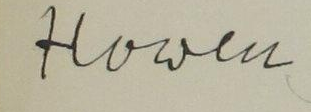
Howen
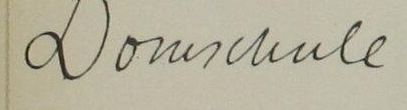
Domschule
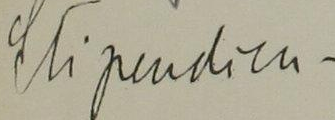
Stipendien
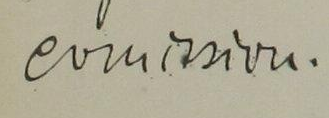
comission
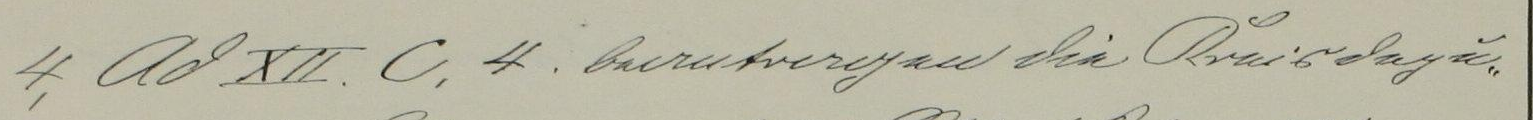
4. Ad XII. C, 4. beantragen die Kreisdepu-
